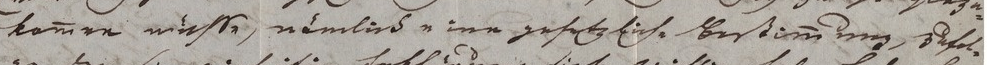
kommen müsse, nämlich eine gesetzliche Bestimmung, zufol-
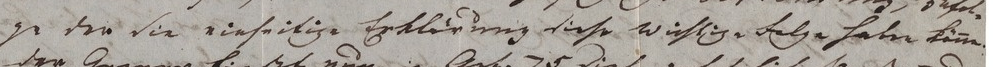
ge der die einseitige Erklärung diese wichtige Folge haben könne.
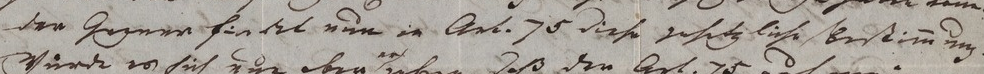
Der Gegner findet nun in Art. 75 diese gesetzliche Bestimmung.
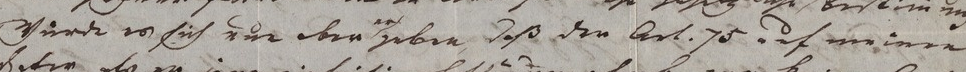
Würde es sich nun aber ergeben, daß der Art. 75 auf meinen
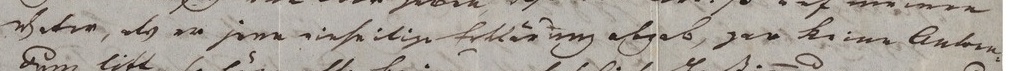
Vater, als er jene einseitige Erkärung abgab, gar keine Anwen-
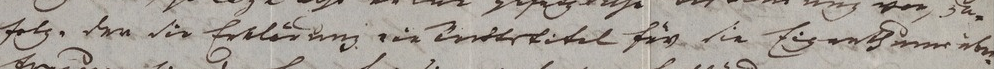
folge der die Erklärung ein Rechtstitel für die Eingethumsüber-
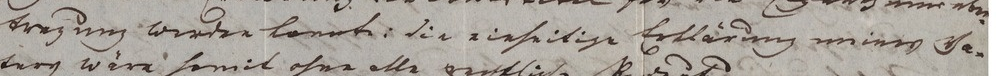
tragung werde konnte. Die einseitige Erklärung meines Va-
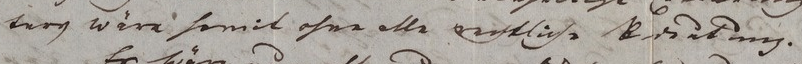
ters wäre somit ohne alle rechtliche Bedeutung.
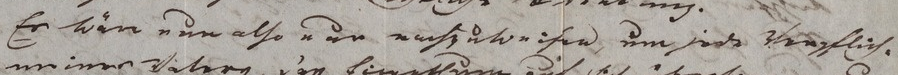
Es wäre nun also nur nachzuweisen, um jede Verpflich-
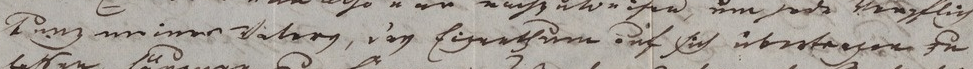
tung meines Vaters, das Eigenthum auf sich übertragen zu
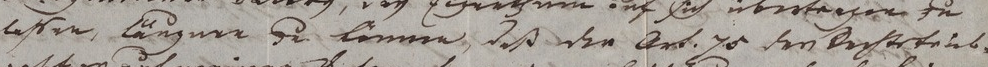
lassen, läugnen zu können, daß der Art. 75 des Rechtstrieb-
